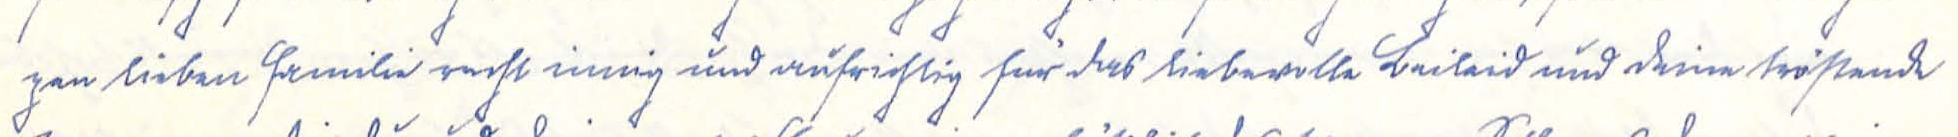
zen lieben Familie recht innig und aufrichtig für das liebevolle Beileid und deine tröstende
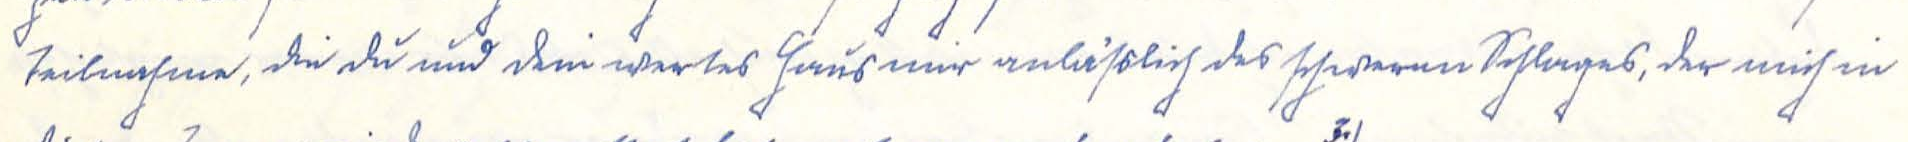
Teilnahme, die du und dein wertes Haus mir anlässlich des schweren Schlages, der mich in
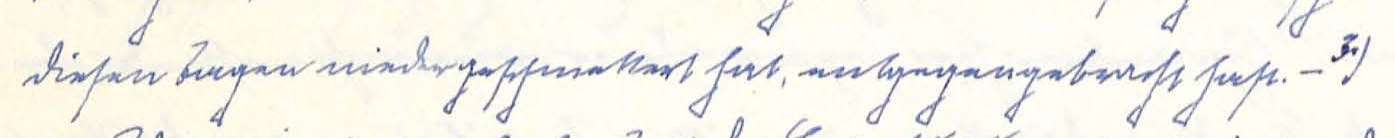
diesen Tagen niedergeschmettert hat, entgegengebracht hast.
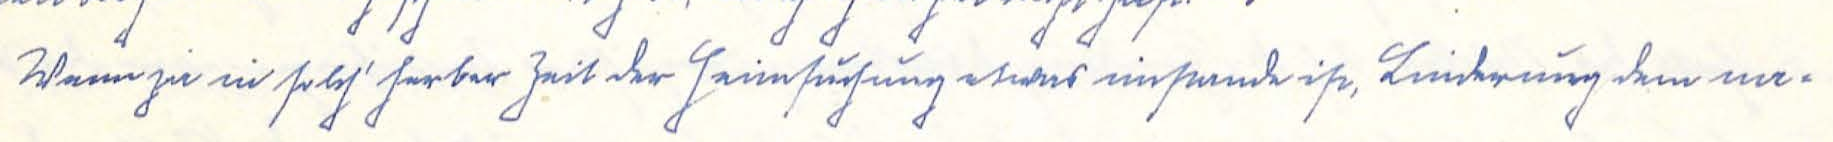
Wenn ja in solch' herber Zeit der Heimsuchung etwas imstande ist, Linderung dem na-
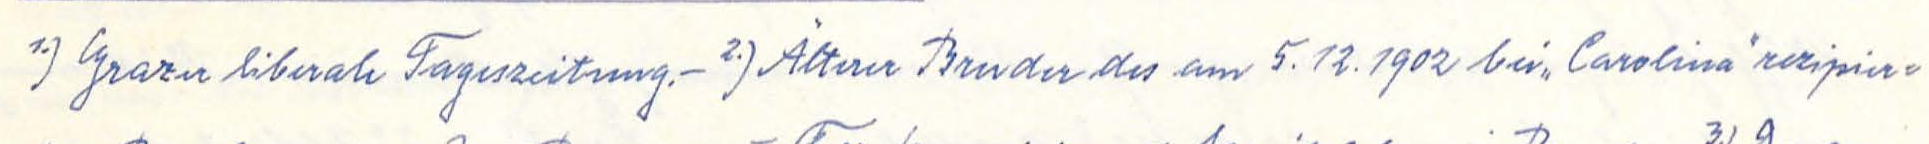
1.) Grazer liberale Tageszeitung.- 2.) Älterer Bruder des am 5. 12. 1902 bei „Carolina“ rezipiert-
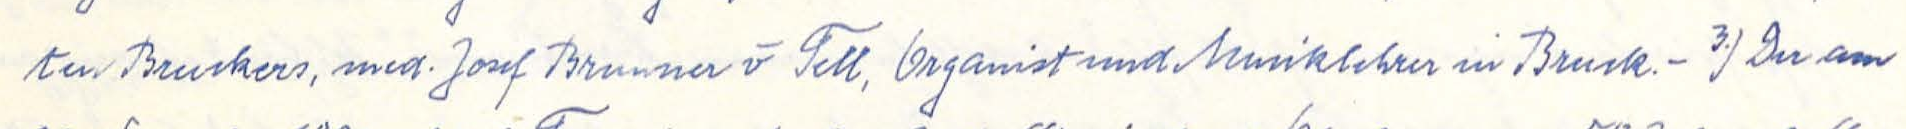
ten Bruckers, med. Josef Brenner v/o Tell, Organist und Musiklehrer in Bruck.- 3) Der am
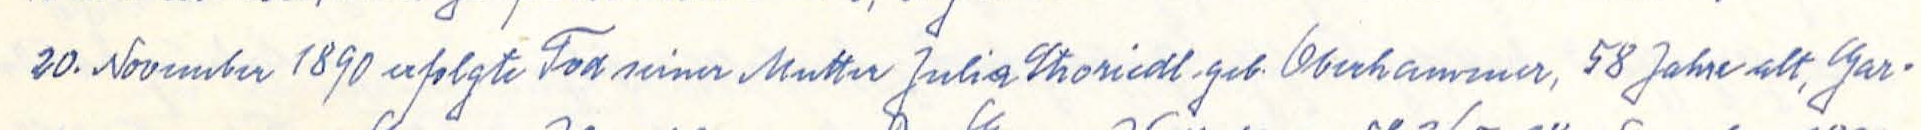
20. November 1890 erfolgte Tod seiner Mutter Julia Stroriedl geb. Oberhammer, 58 Jahre alt, Gar-
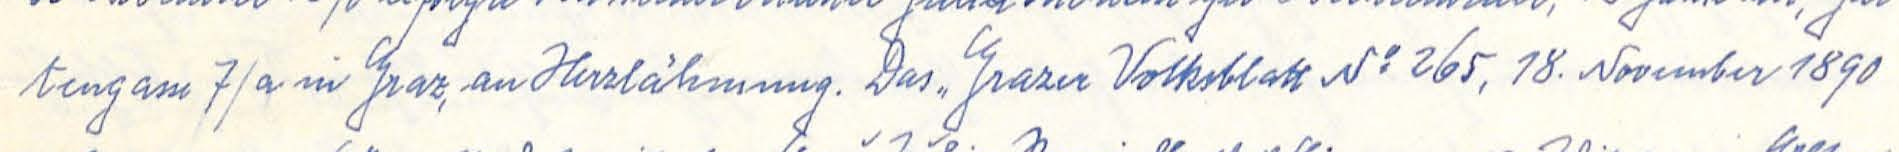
tengasse 7/a in Graz, an Herzlähmung. Das "Grazer Volksblatt" Nr. 265, 18. November 1890
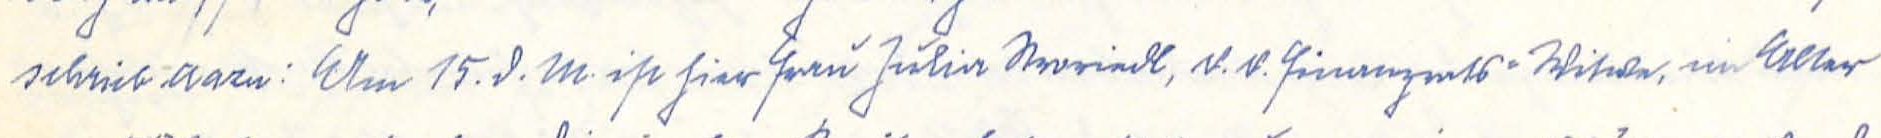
schrieb dazu: Am 15. d. M. ist hier Frau Julia Stroriedl, k. k. Finanzrats - Witwe, im Alter
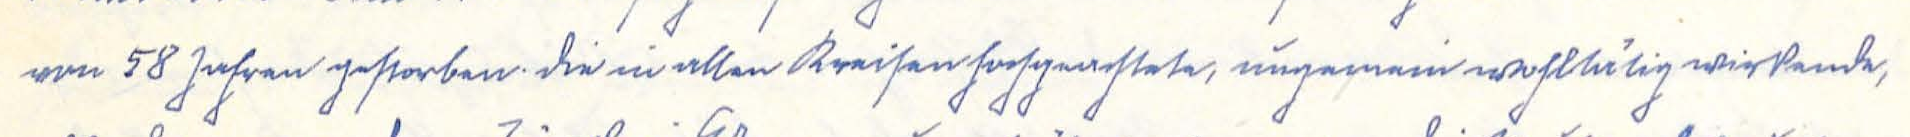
von 58 Jahren gestorben. Die in allen Kreisen hochgeachtete, ungemein wohltätig wirkende,
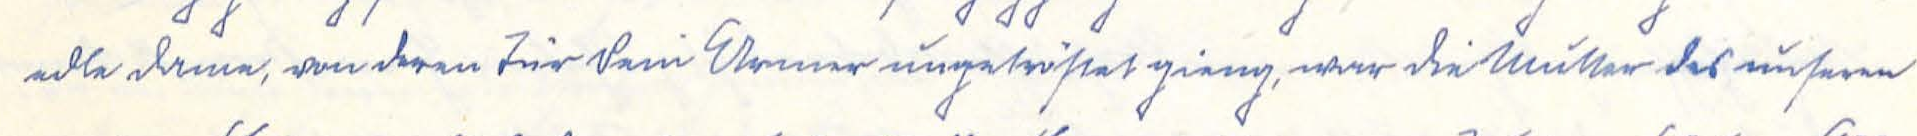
edle Dame, von derer Tür kein Armer ungetröstet gieng, war die Mutter des unseren
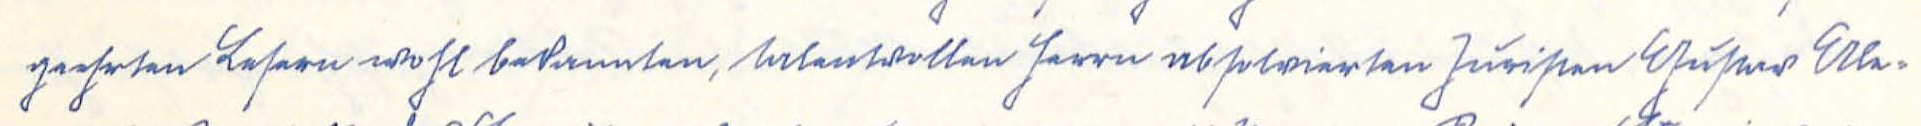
geehrten Lesern wohl bekannten, talentvollen Herrn absolvierten Juristen Gustav Ale-
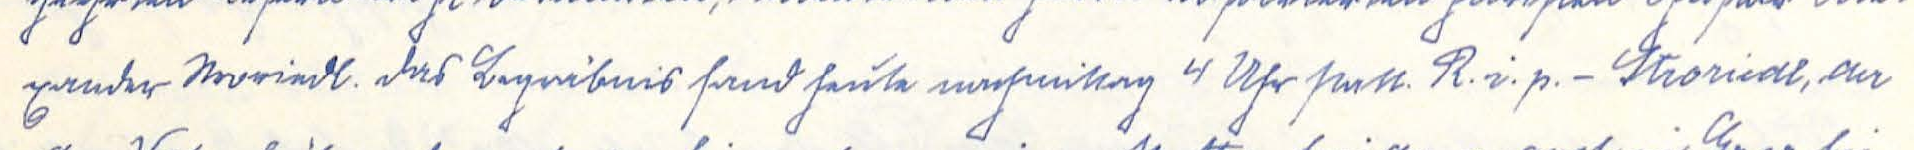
xander Stroriedl. Das Begräbnis fand heute nachmittag 4 Uhr statt. R. i. P. - Stroriedl, der
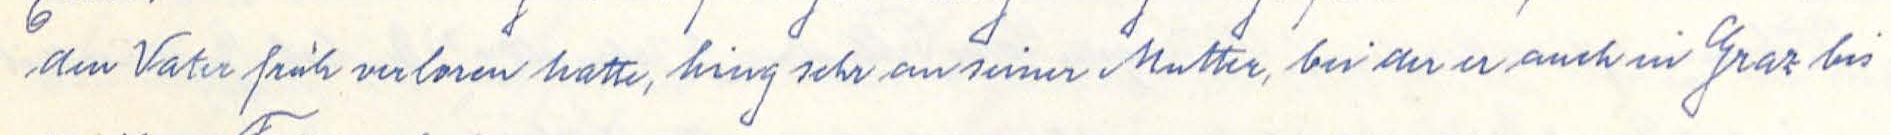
den Vater früh verloren hatte, hing sehr an seiner Mutter, bei der er auch in Graz bis
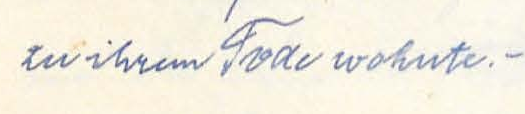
zu ihrem Tode wohnte.
